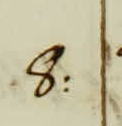8:
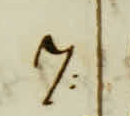7:
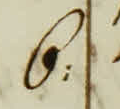6:
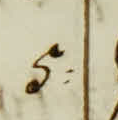5:
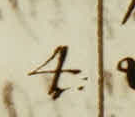4:
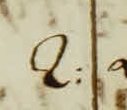2:
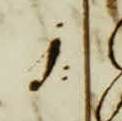1:
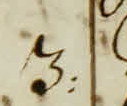3:
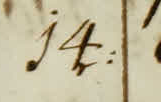14:
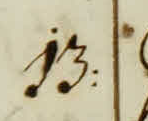13:
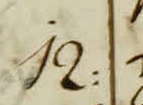12:
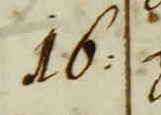16:
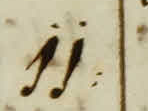11:
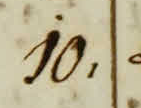10:
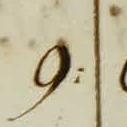9:
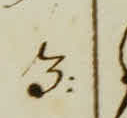3:
